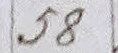58
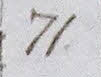71
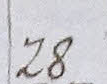28
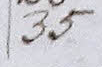35
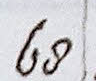68
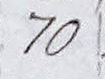70
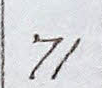71
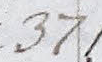37
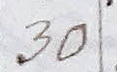30
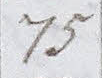75
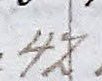42
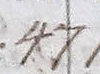47
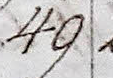49
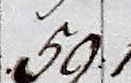59
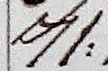71
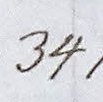34
